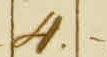4.
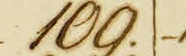109.
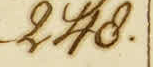248.
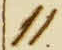11.
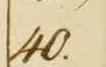40.
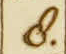8.
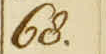68.
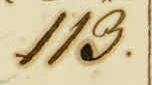113.
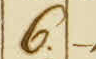6.
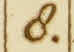8.
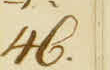46.
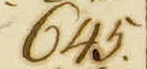645.
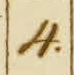4.
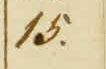15.
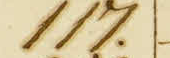117.
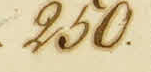250.
